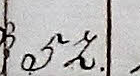52.
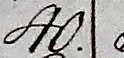40.
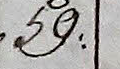59.
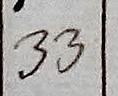33.
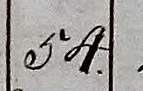54.
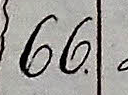66.
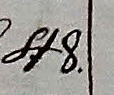48.
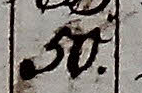50.
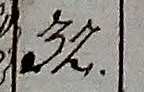32.
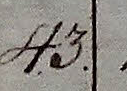43.
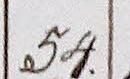54.
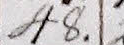48.
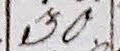30
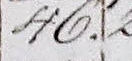46.
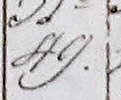49.
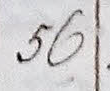56
